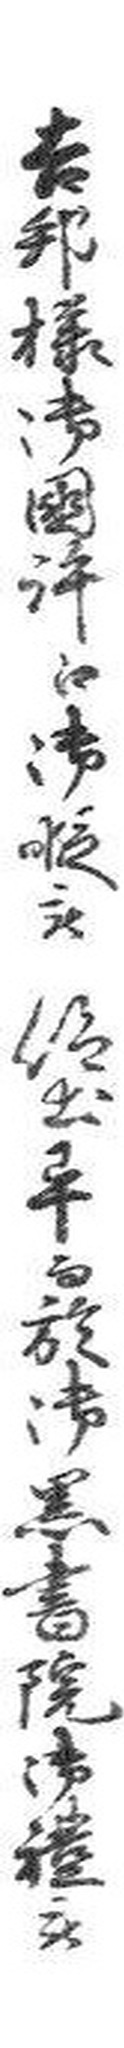吉邦様御国許江御暇被仰出畢而於御黒書院御礼被
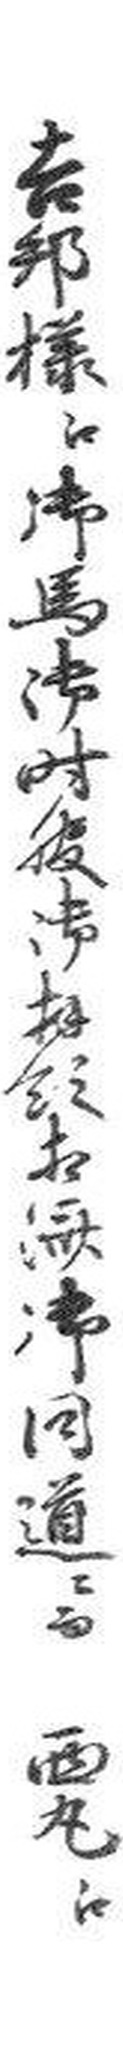吉邦様江御馬御時服御拝領相済御同道ニ而西丸江
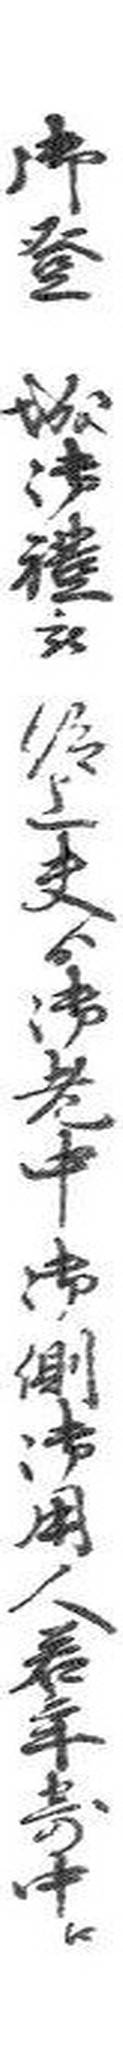御登城御礼被仰上夫ゟ御老中御側御用人若年寄中江
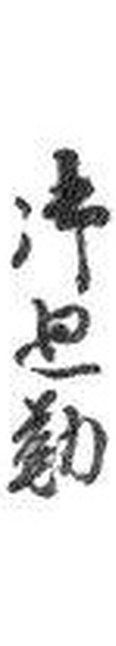御廻勤
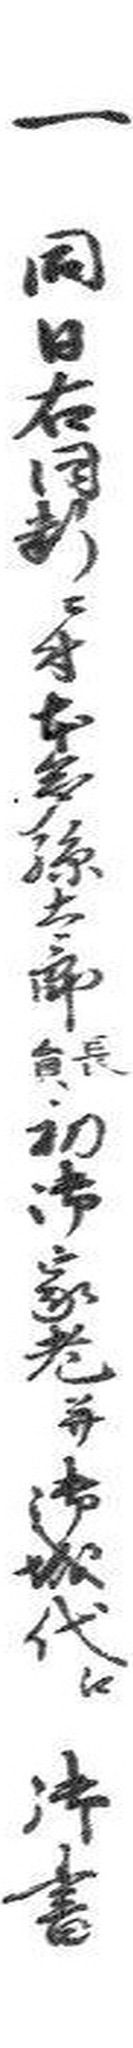一同日右同断ニ付本多孫太郎長員初御家老并御城代江御書
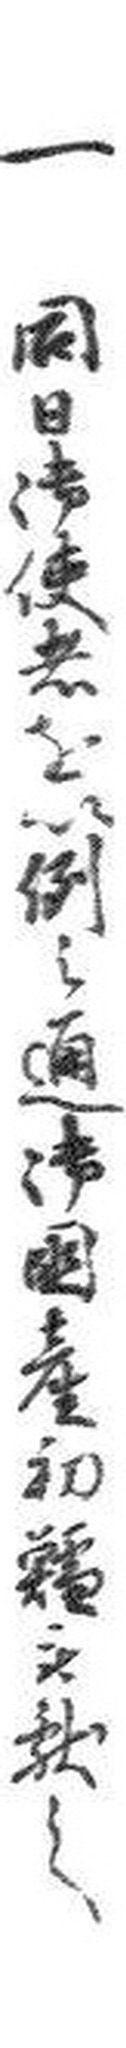一同日御使者を以例之通御国産初鱈被献之
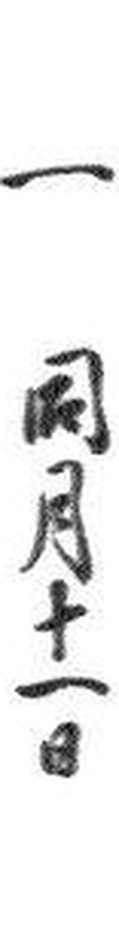一同月十一日
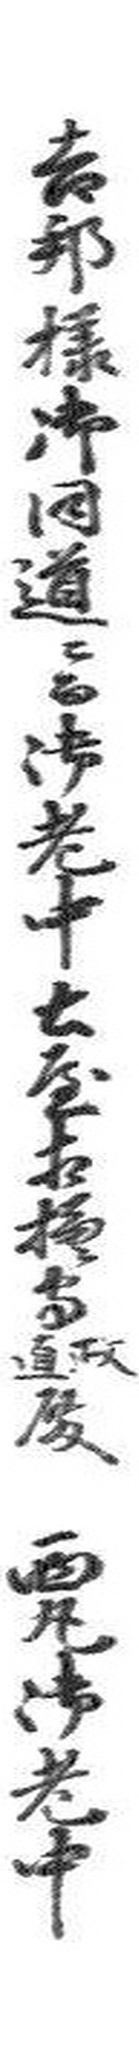吉邦様御同道ニ而御老中土屋相模守政直殿西丸御老中
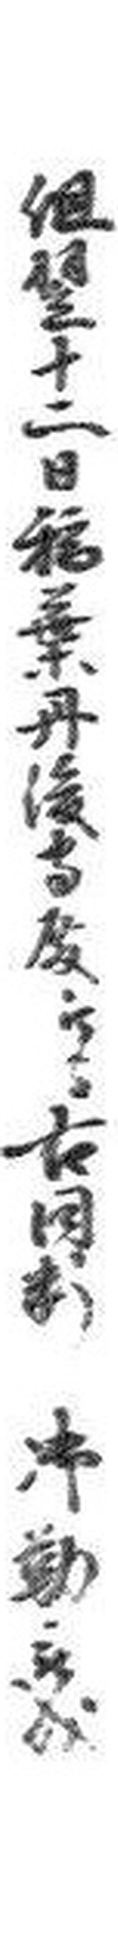但翌十二日稲葉丹後守殿江も右同断御勤被成
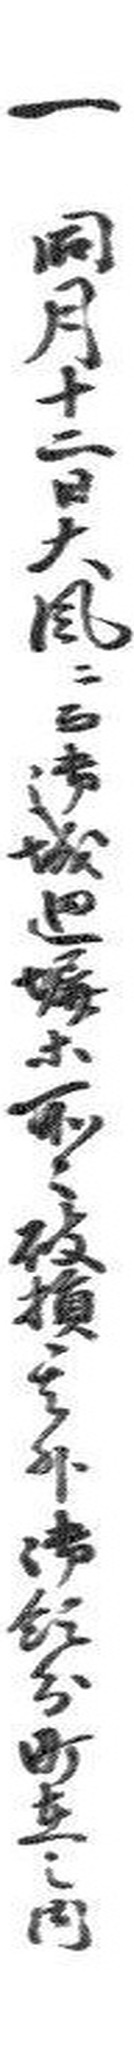一同月十二日大風ニ而御城廻塀等所々破損其外御領分町在之内
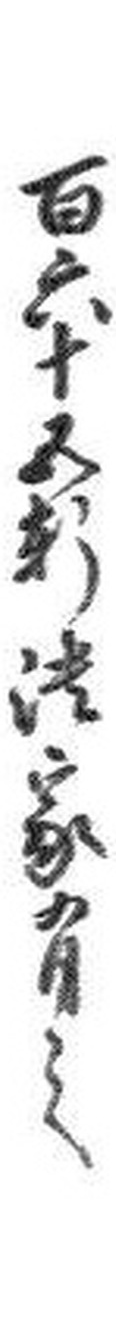百六十五軒潰家有之
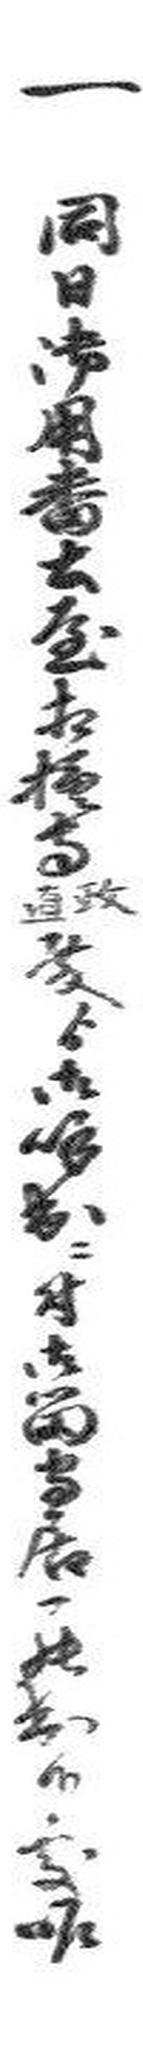一同日御用番土屋相模守政直殿ゟ御呼出ニ付御留守居罷出候処昨
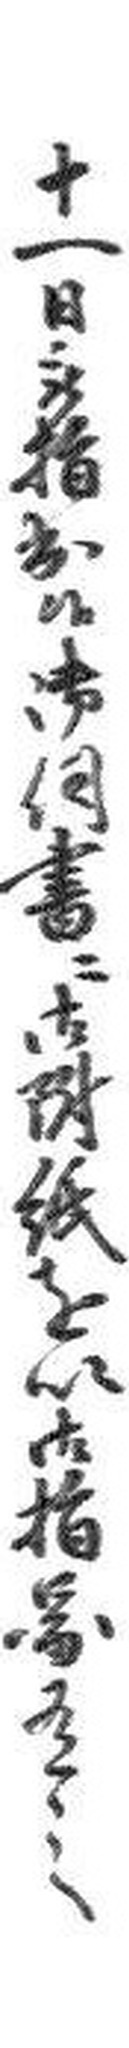十一日披指出候御伺書ニ御付紙を以御指図有之
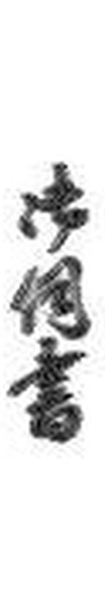御伺書
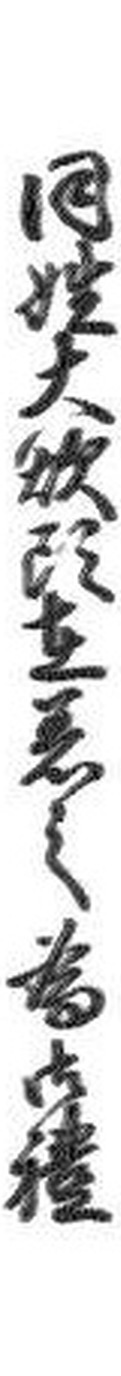同姓大炊頭在着之為御礼

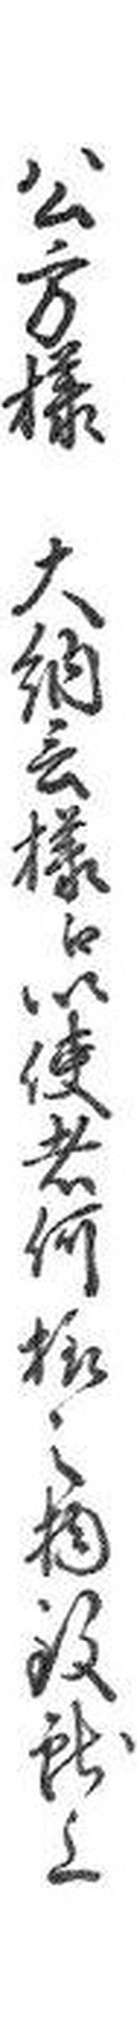公方様大納言様江以使者何様之物致献上
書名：家譜 二十四 吉品公 従宝永三年到同五年
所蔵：福井県文書館 Fukui Prefectural Archives
